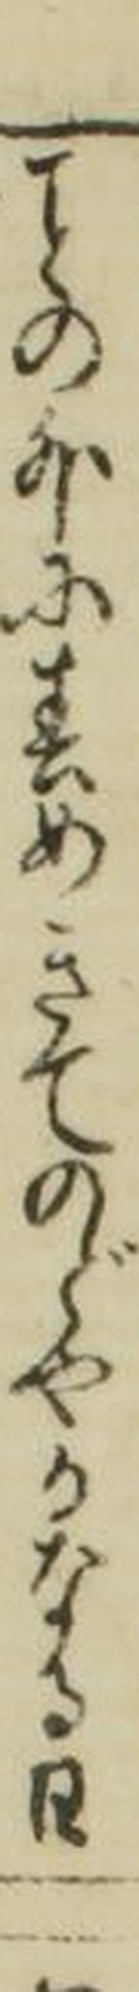ことの外に春めきてのどやかなる日
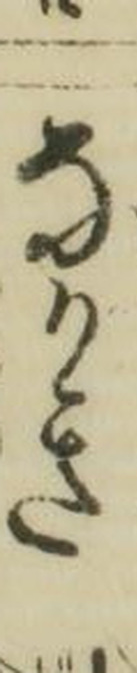なかき
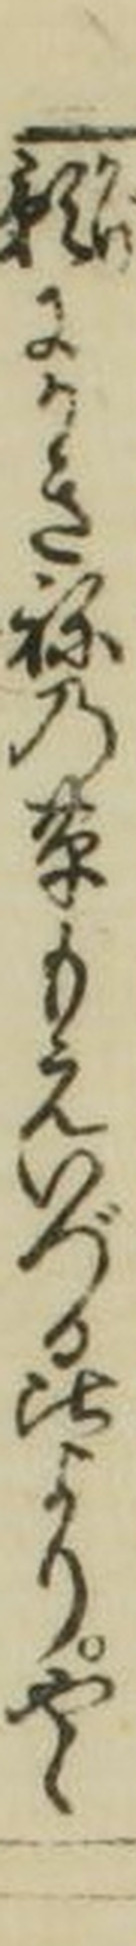影にかきねの草もえいづる比より。やゝ
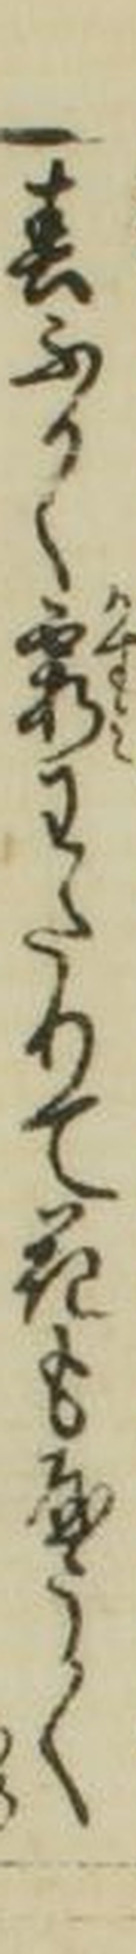春ふかく霞わたりて花もやう〳〵
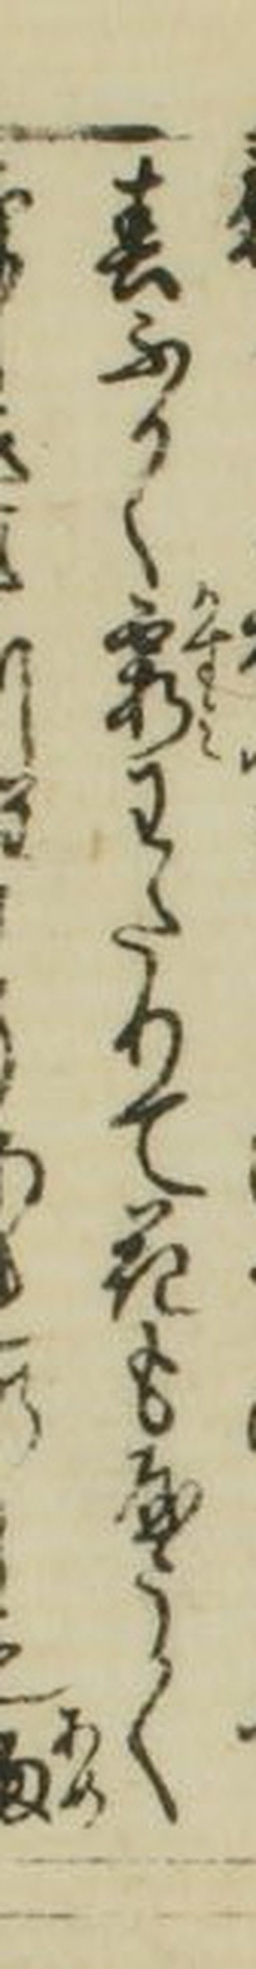けしきたつ程こそあれ折しも雨
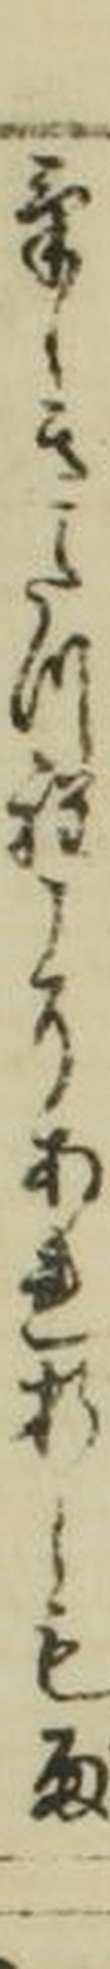けしきたつ程こそあれ折しも雨
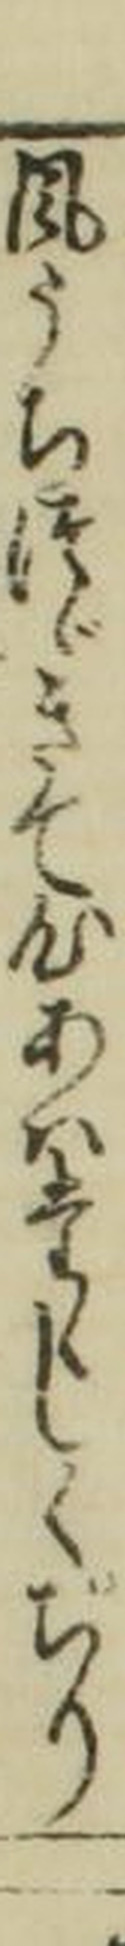風うちつゞきて心あはたゝしく。ちり
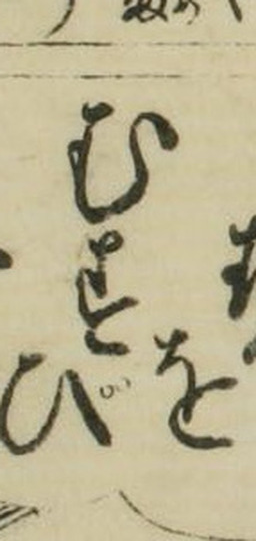むすび
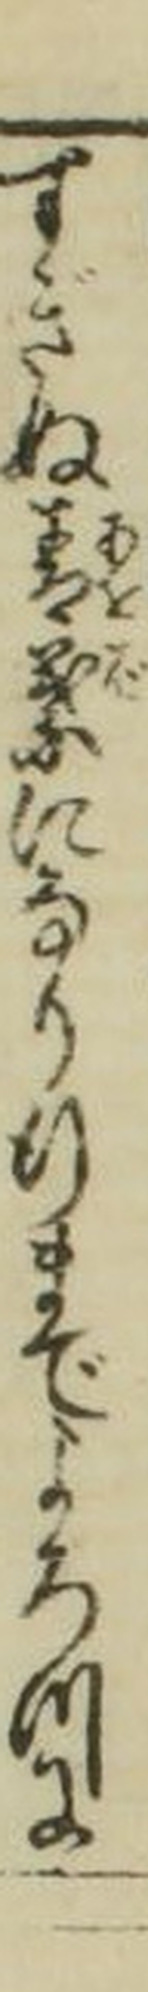すぎぬ青葉になる行までよろつに
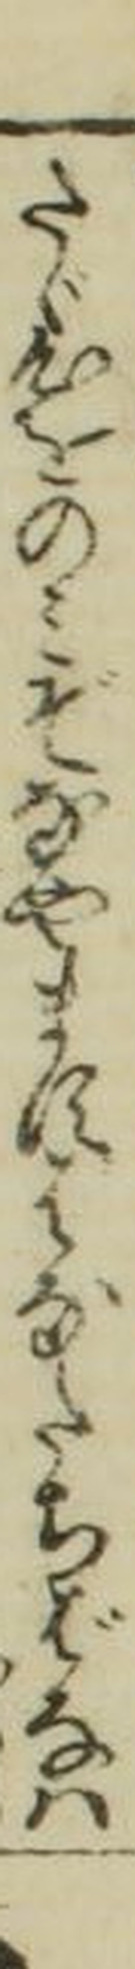たゞ心をのみぞなやますはなたちばなは
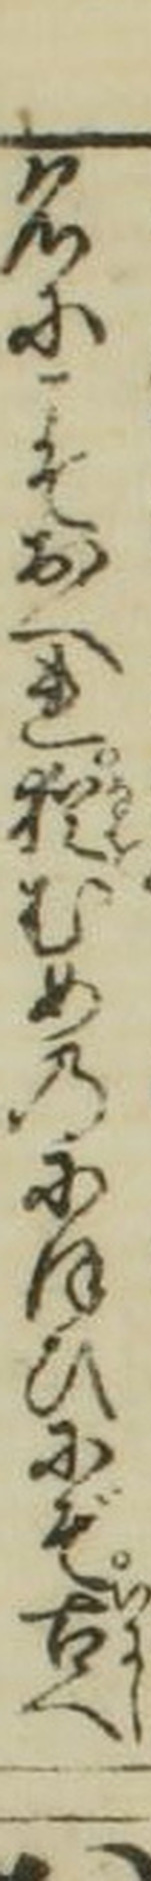名にこそおへれ。猶むめのにほひにぞ。古へ
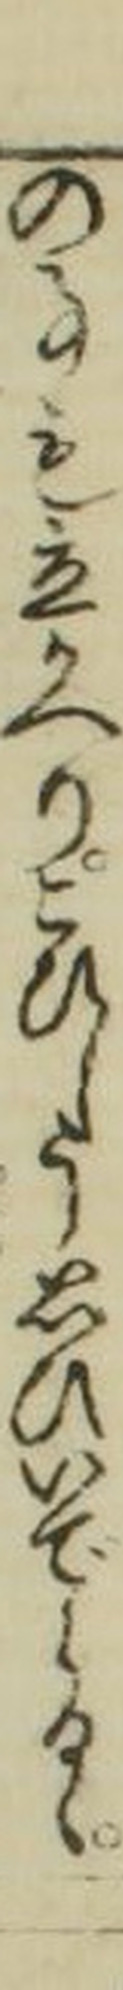の事も立かへり。こひしう思ひいでしるし。
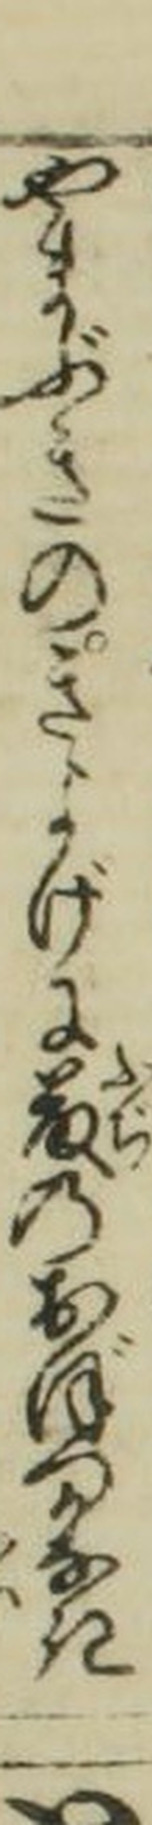やまぶきの。きよげに藤のおぼつかなき
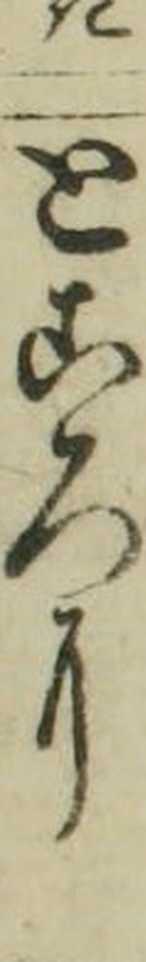ところに
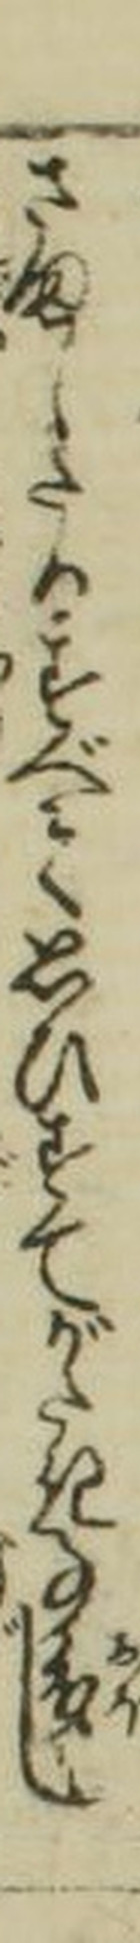さましたるすべて思ひすてがたき事多し
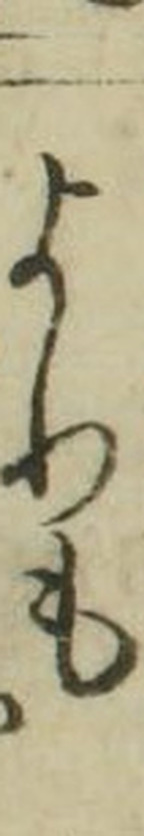よりも
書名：女源氏教訓鑑
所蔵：東京学芸大学附属図書館
